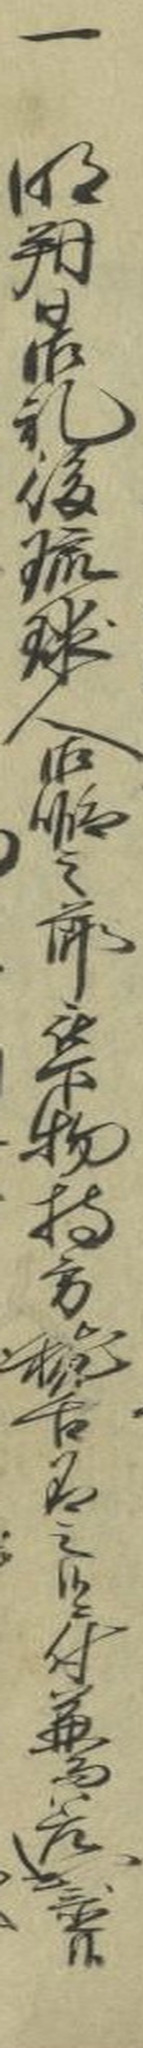一明朔日御礼後琉球人御暇之節被下物持方稽古有之候に付兼て差出置候
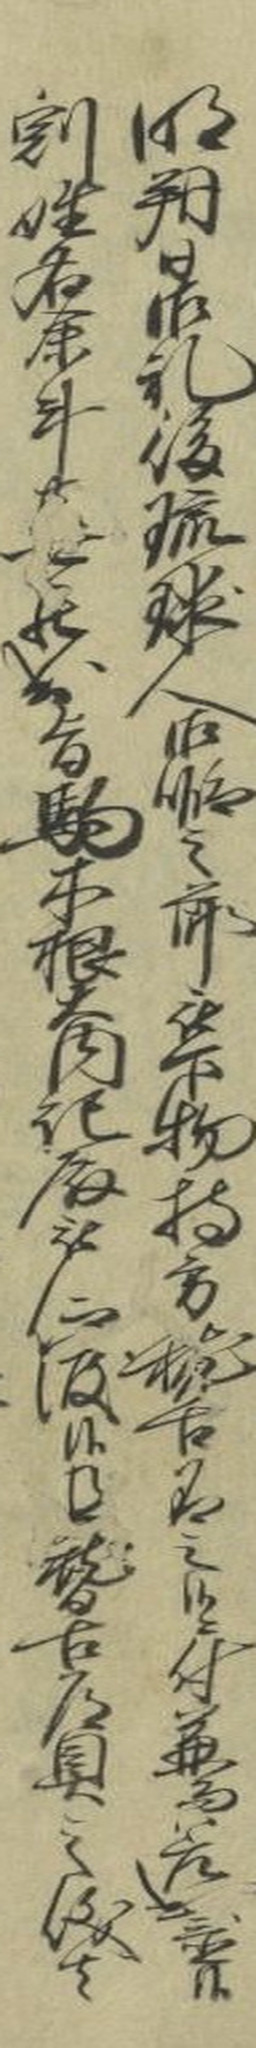割姓名余計共可罷出旨駒木根大内記殿被仰渡候且稽古道具之儀は
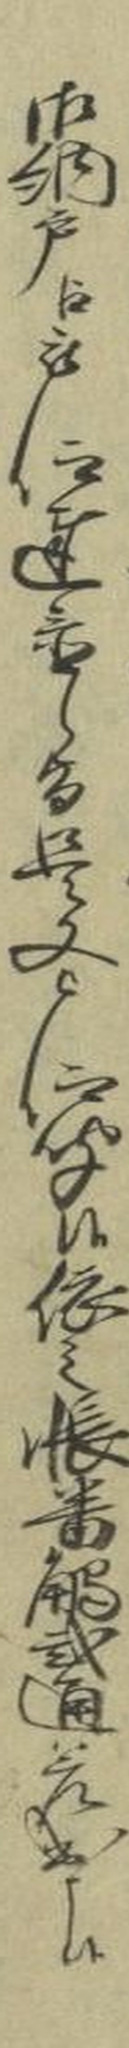御納戸え被仰達置候旨是又被仰聞候依之帳番触弐通差出申候
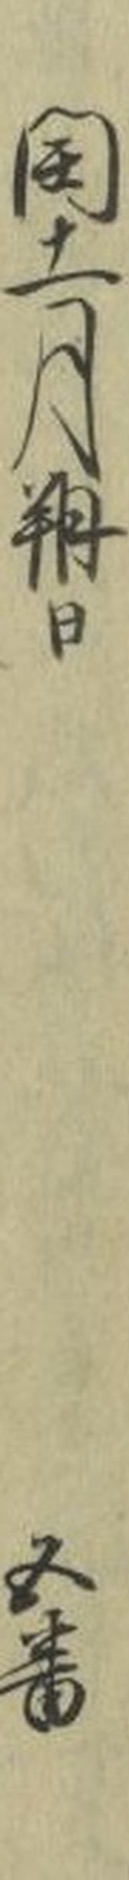閏十一月朔日五番
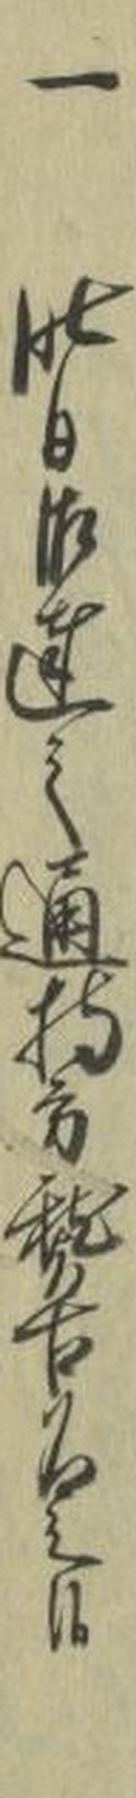一昨日御達之通持方稽古有之候
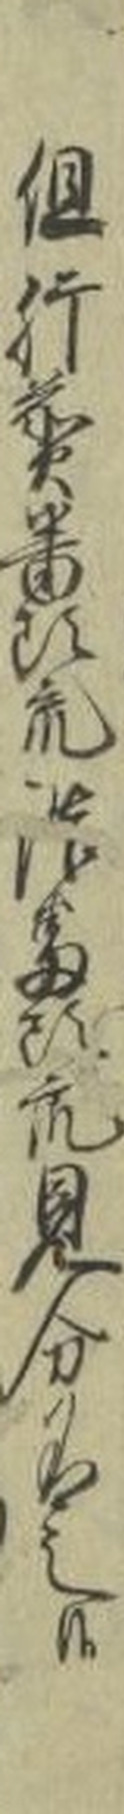但肝煎番頭衆詰番頭衆見分有之候
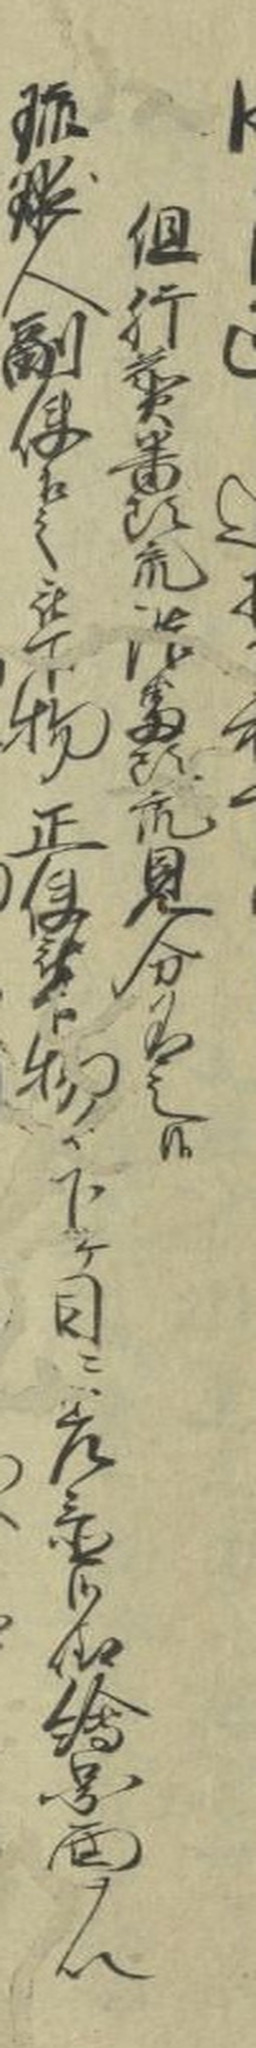一琉球人副使え之被下物正使被下物ゟ下け目に差置候様絵図面を以
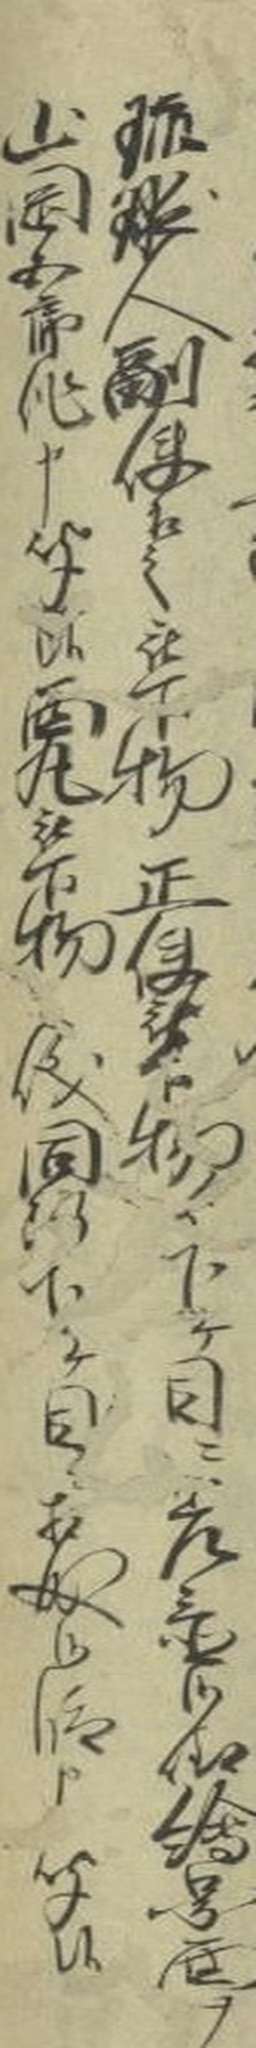山岡五郎作申聞候西丸被下物之儀同断下け目に相成候段申聞候
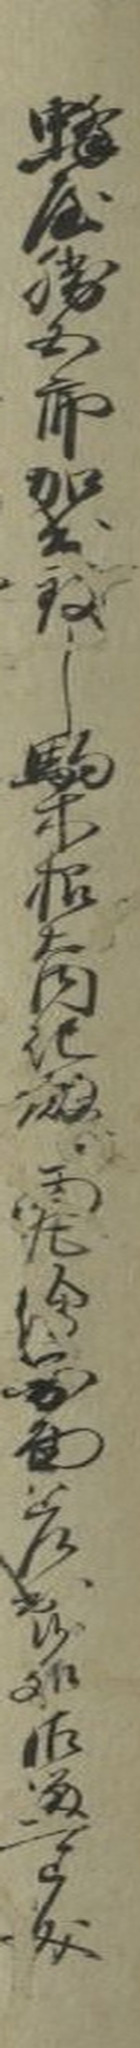一蜂屋勝五郎加出致し駒木根大内記殿え西丸絵図面差出候処御留可被成
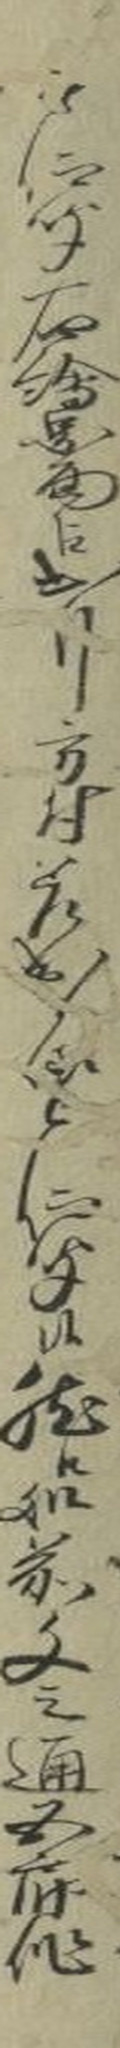被仰聞右絵図面え出引方付差出候様被仰聞候然る処前文之通五郎作
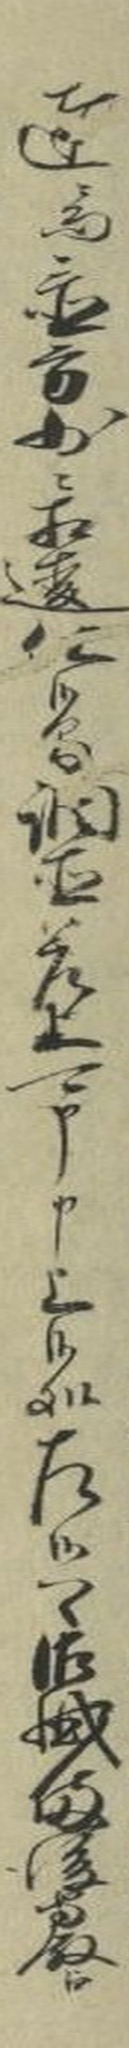達にて置方少々相違仕候間調直差上可申申上候処左候はゝ御掛備後守殿え
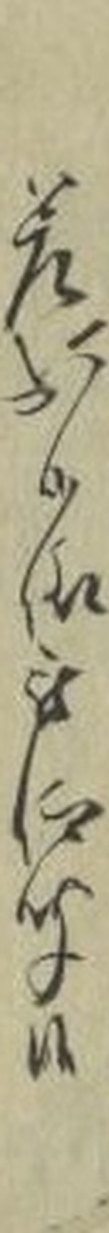差出候様被仰聞候
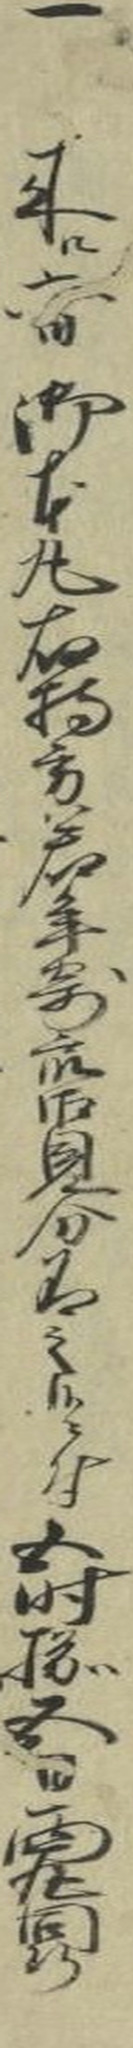一来る六日御本丸右持方若年寄衆御見分有之候に付五時揃五日西丸同断
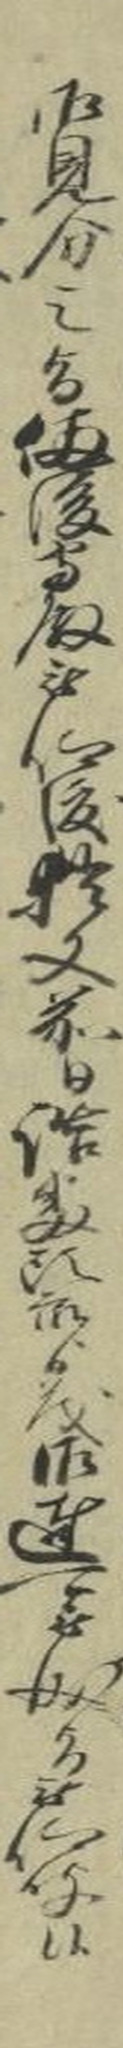御見分之旨備後守殿被仰渡猶又前日詰番頭衆ゟも御達可被成旨被仰聞候
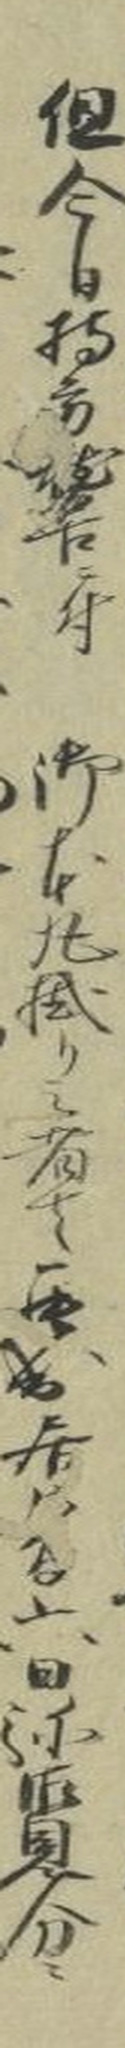但今日持方稽古に付御本丸掛り之者は罷出居候間六日弥御見分に
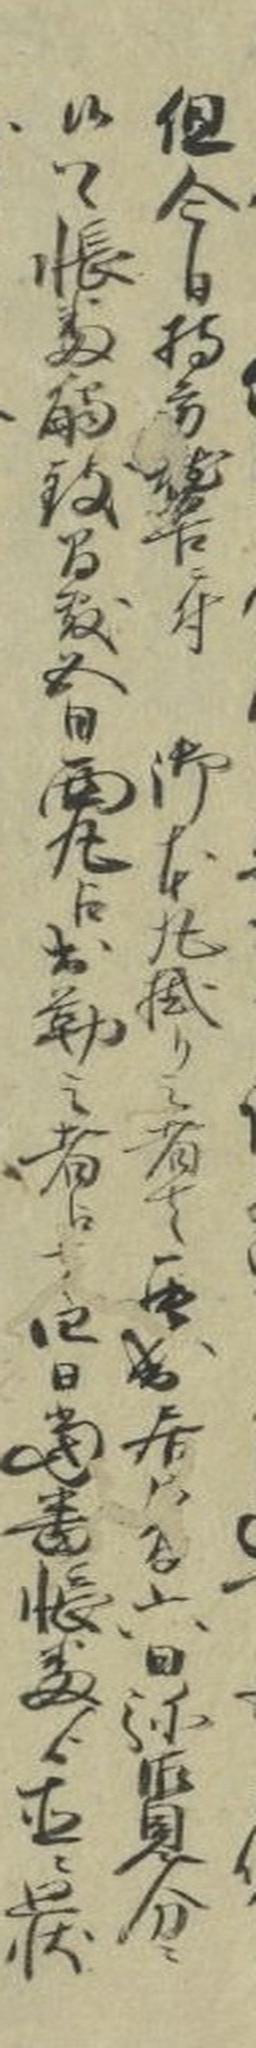候はゝ帳番触致間敷五日西丸え出勤之者えは四日当番帳番より直に廻状
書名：天保三壬辰年琉球人参府之節勤方書留
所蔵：University of the Ryukyus Library
